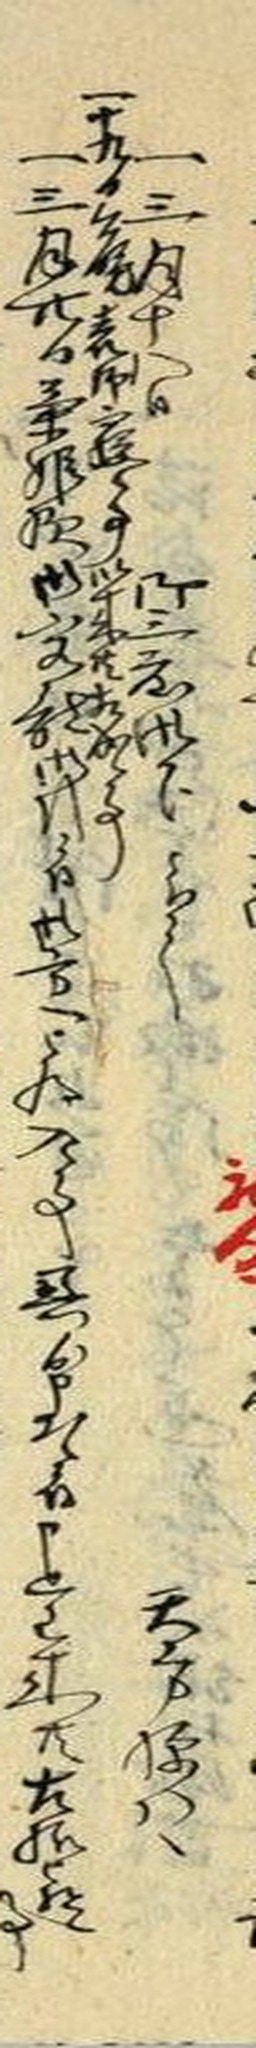一三月廿日菊姫様御容體御引ニ付御方へ被為入候事奥ゟ申出候ニ付申上已来共左様被遊候事
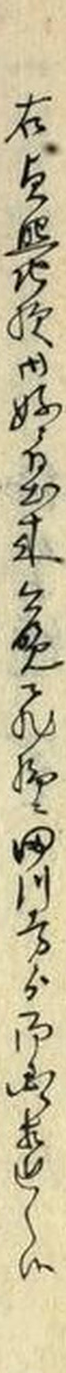右貞照院様御好ニ付出来今晩飛脚ニ田川方ゟ御国へ相廻し候
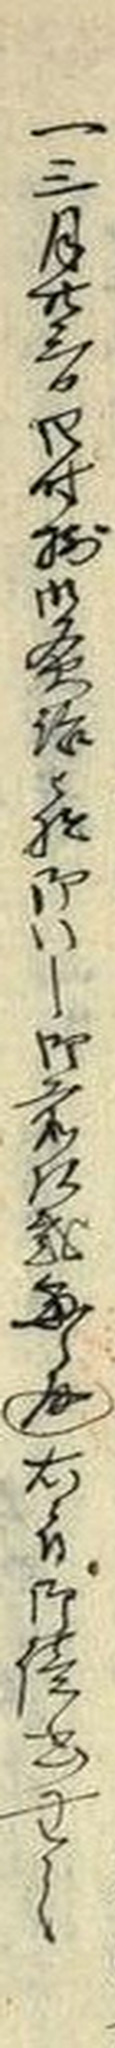一三月廿三日四時揃御灸治被遊御いし御前頂戴毎之通右ニ付御読書無之
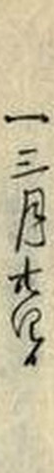一三月廿四日
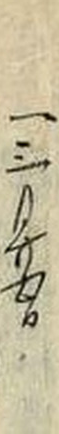一三月廿五日
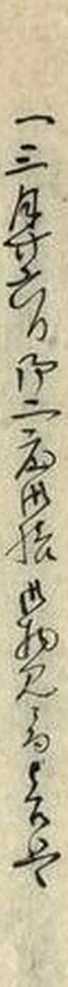一三月廿六日御二度御膳御物見ニ而被召上候
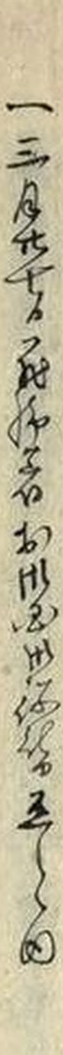一三月廿七日飛脚着於御国御役替有之由
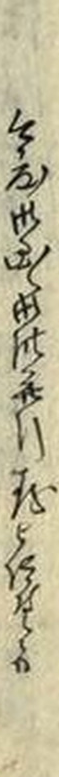今度御国へ御供并引越被仰付候ニ付
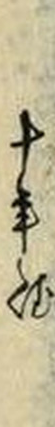十年賦

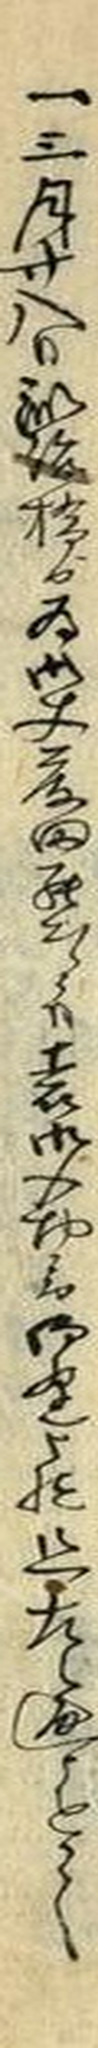一三月廿八日鍛冶橋ゟ為御使藤田罷出候ニ付表御〆切ニ而御逢被遊且左之通被進之
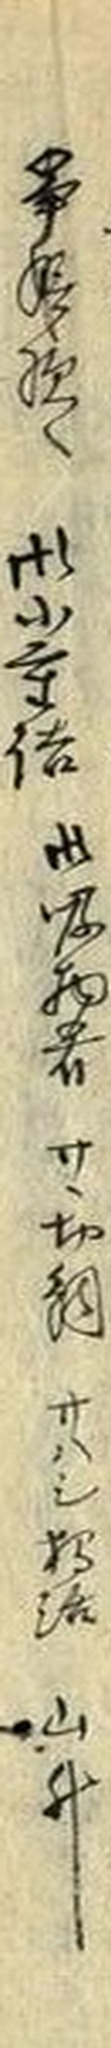箏姫様へ御小重詰御吸物肴サゝ切鯛サハシ独活山升
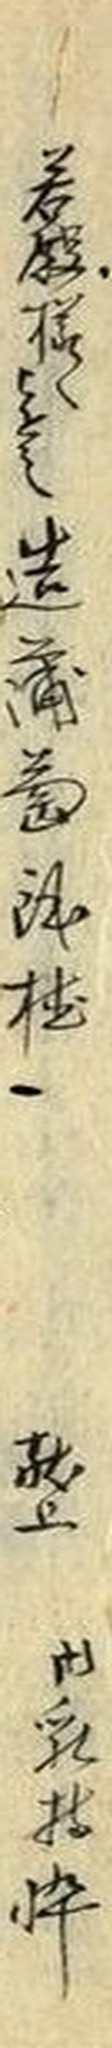若殿様へ被進之造葡萄鉢植献上御乳持伜
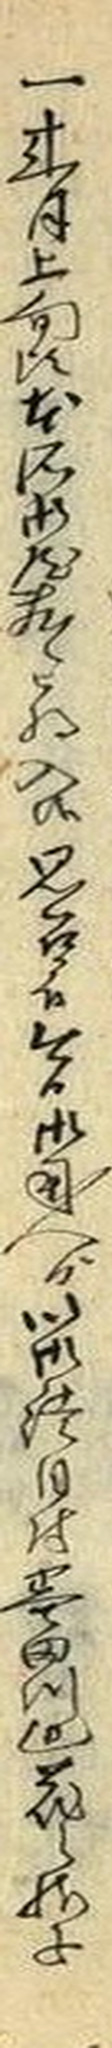一来月上旬頃本所御屋敷へ被為入候思召ニ付今日御用人ゟ以御徒目付墨田川辺花之様子
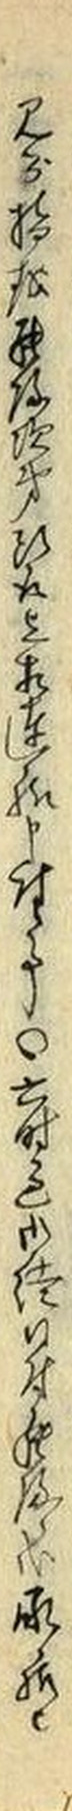見分指越罷帰次第頭取迄相達候様申付候事〇六時過御徒目付罷帰候哉承候様被
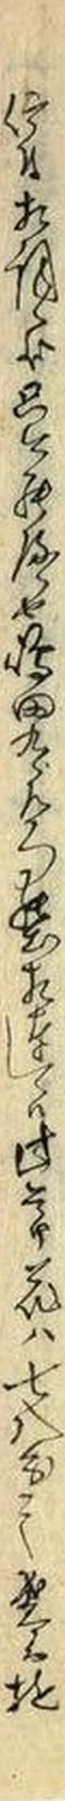仰付相伺候処只今罷帰候由嶋田九郎左衛門罷出相達候付此節花ハ七八分之盛ニ而遊
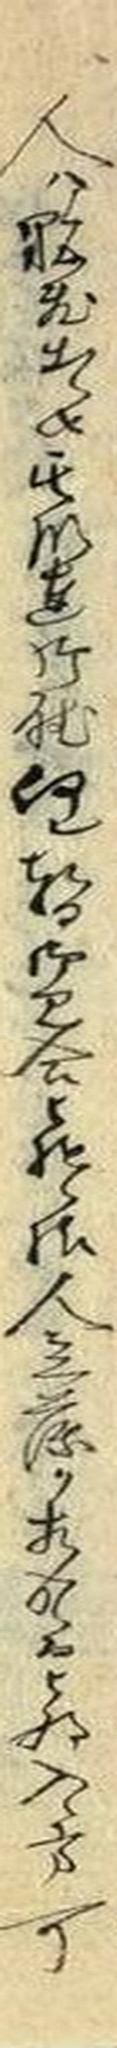人ハ夥敷出候由其段達御聴何レ都而御見合被遊候様人立薄ク相成候而被為入候方可
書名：少傅日録抄（斉承付側向頭取日記、在府）
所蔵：福井県文書館 Fukui Prefectural Archives
